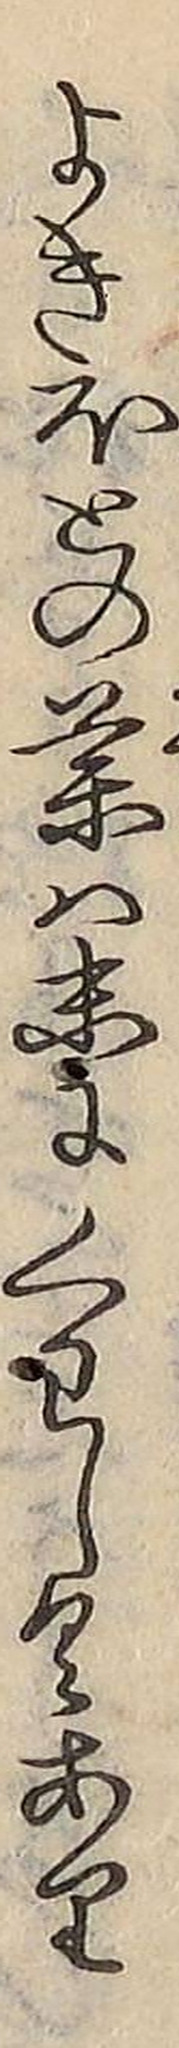よきほとの薬は末にくわしくあり
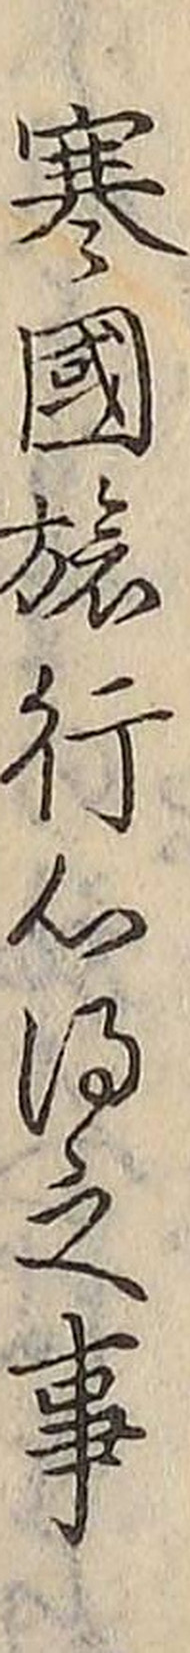寒国旅行心得之事
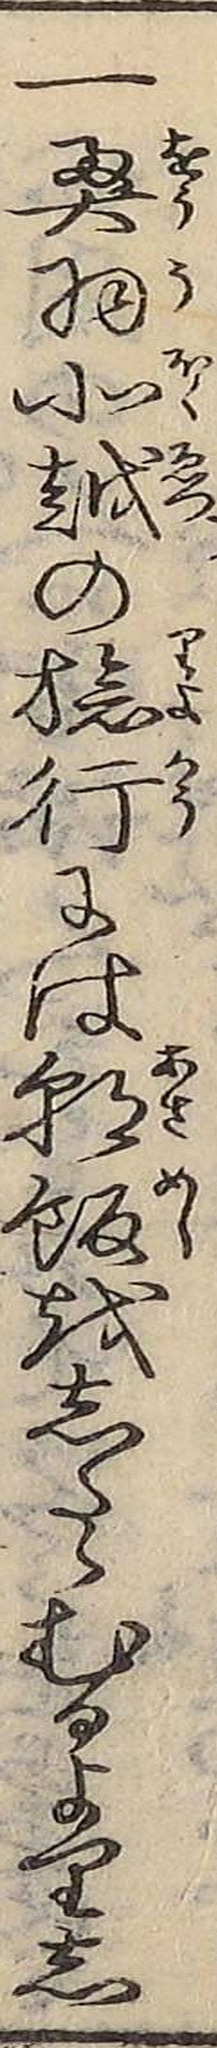一奥羽北越の旅行には朝飯をしたゝむるよりし
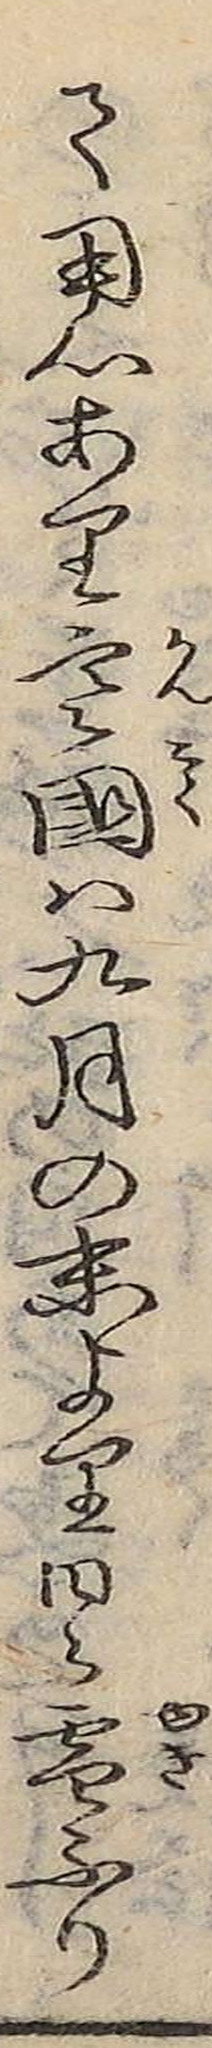て用心あり寒国は九月の末より日々雪ふり
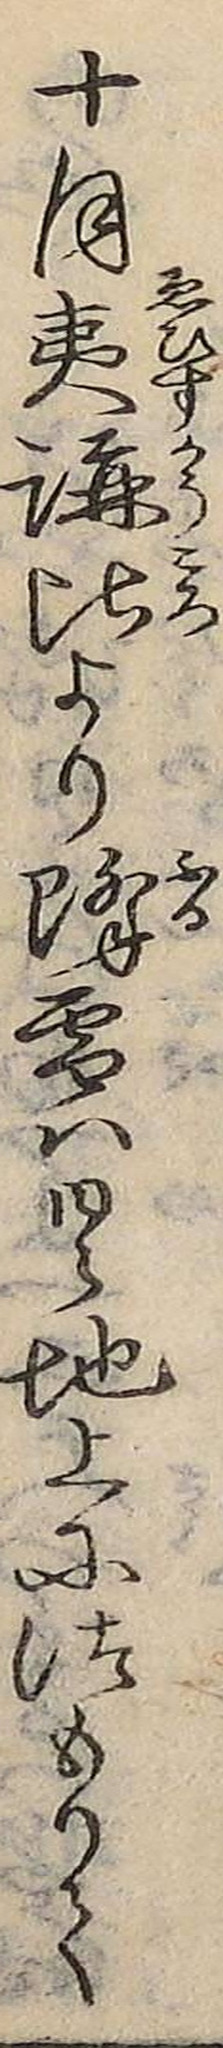十月夷講比より降雪は日々地上につもりて
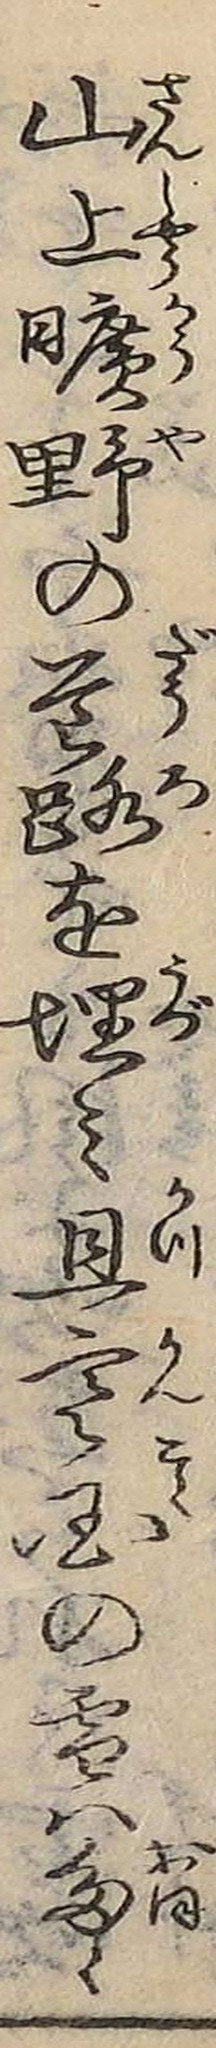山上曠野の道路を埋み且寒国の雪は多く

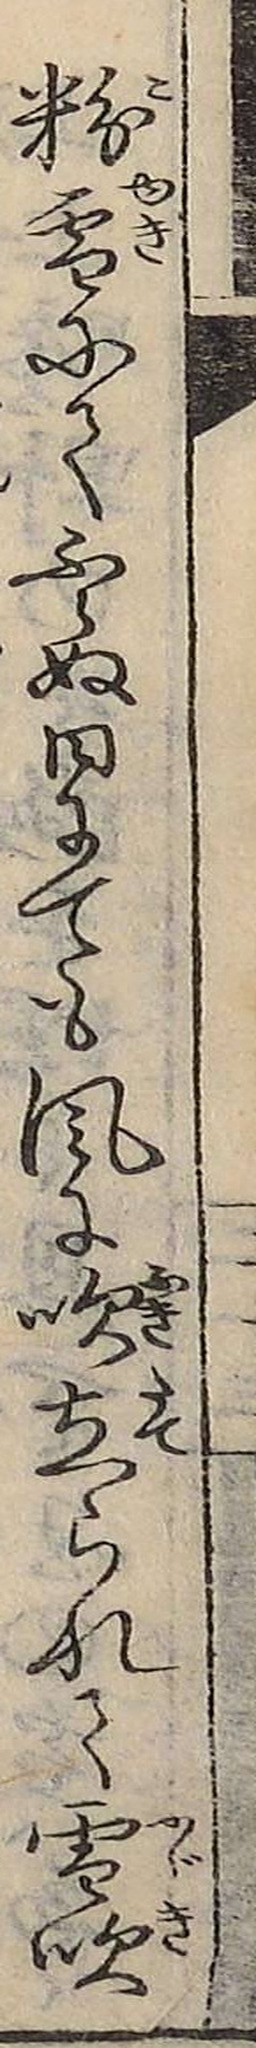粉雪にてふらぬ日にても風に吹立られて雪吹
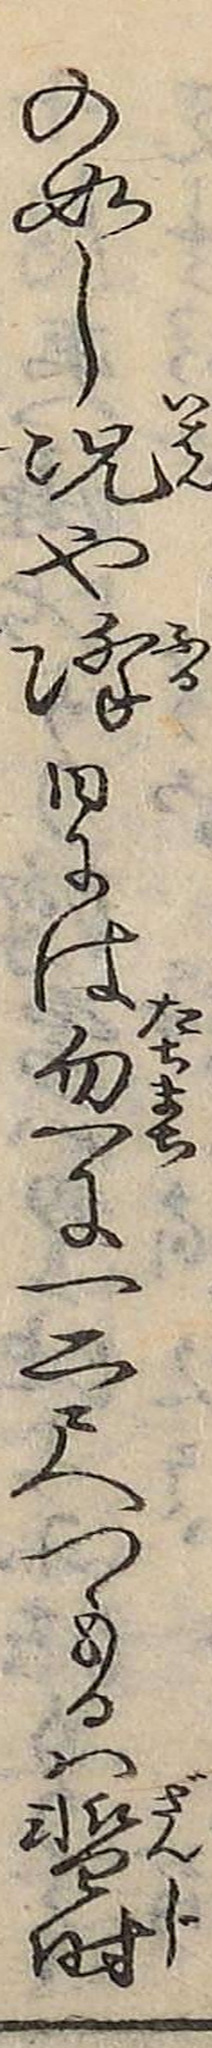の如し況や降日には忽に一二尺つもるは暫時
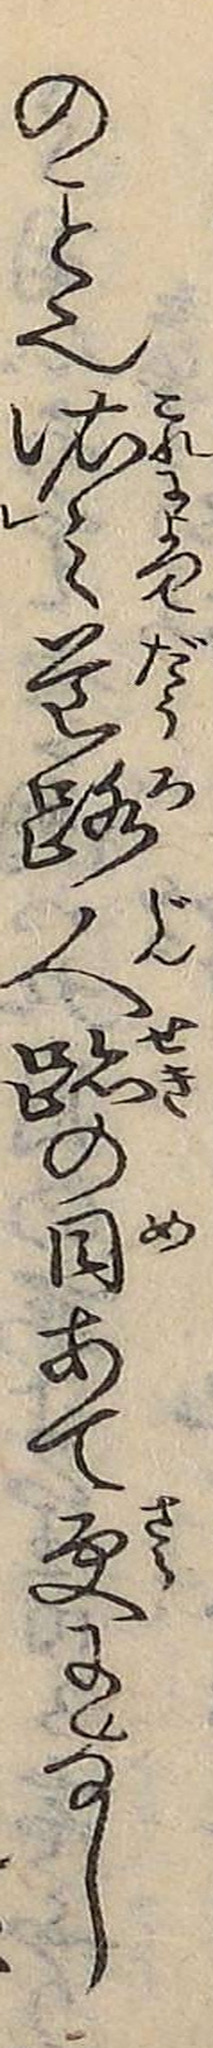のこと也依之道路人跡の目あて更になし
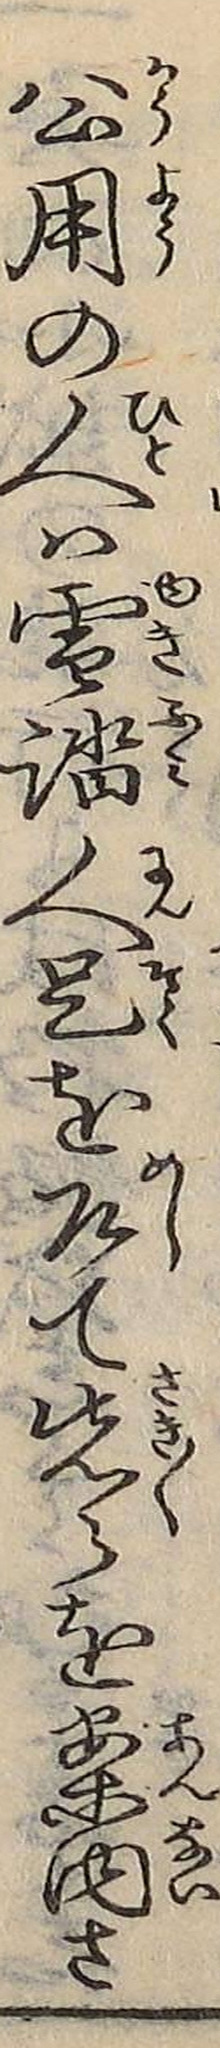公用の人は雪踏人足を召て先々を案内さ
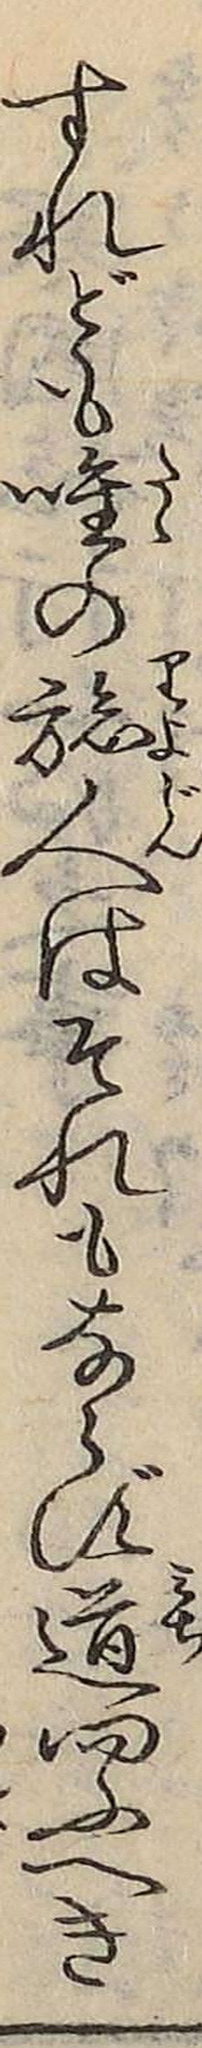すれども唯の旅人はそれもならず道問ふへき
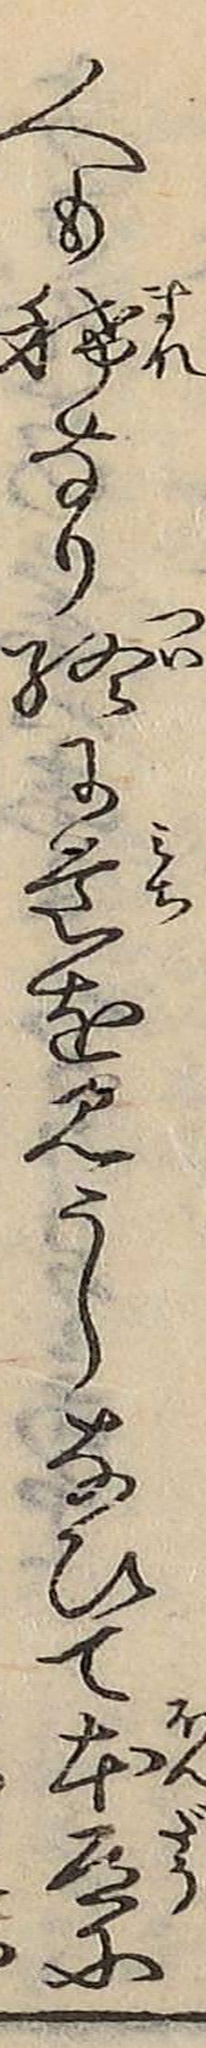人も稀なり終に道を見うしなひて本道に
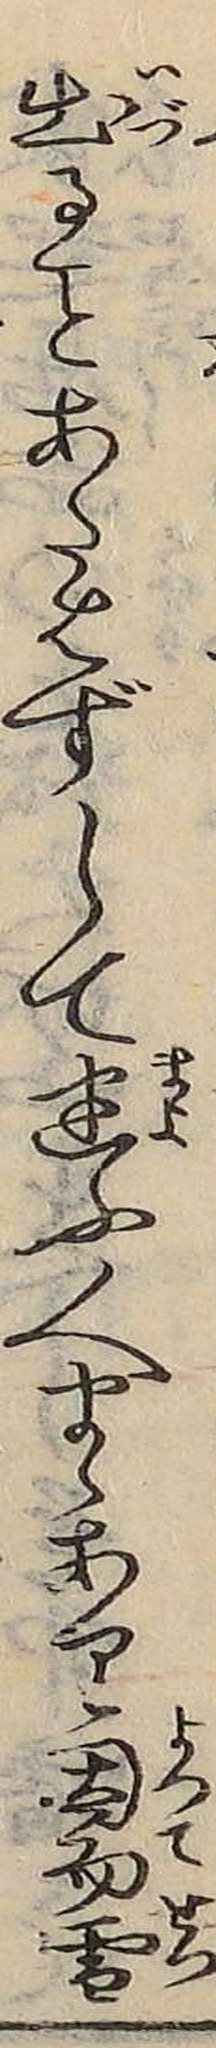出ることあたはずして迷ふ人まゝあり因而雪
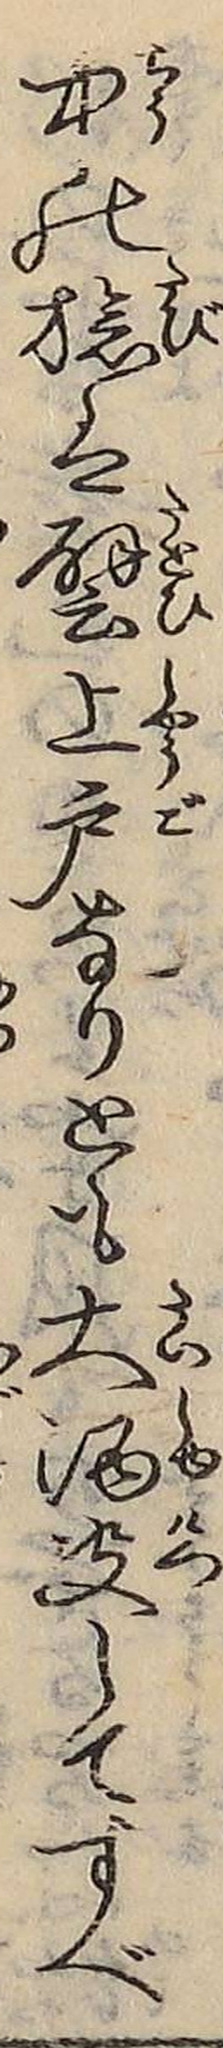中の旅は譬上戸なりとも大酒決してすべ
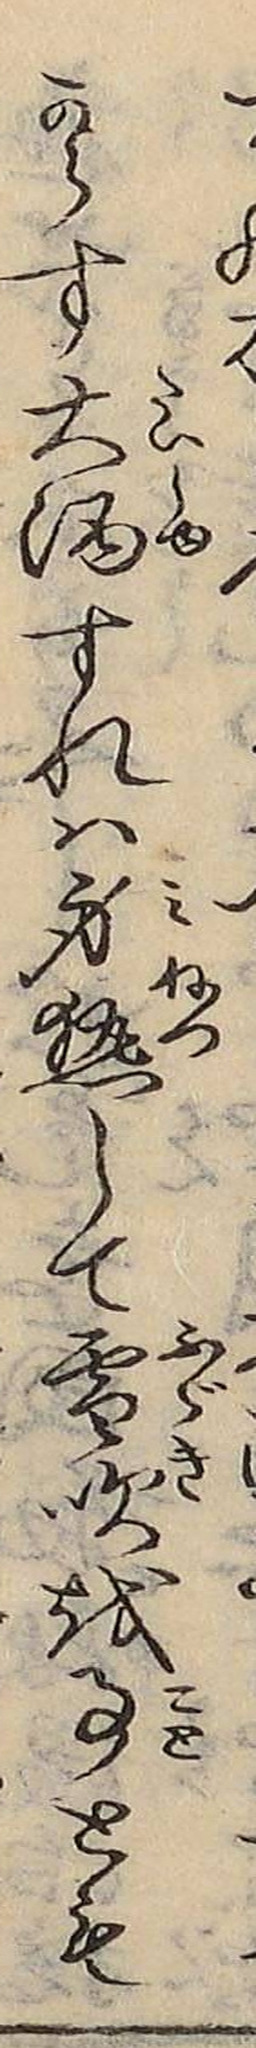からす大酒すれは身熱して雪吹を事とも
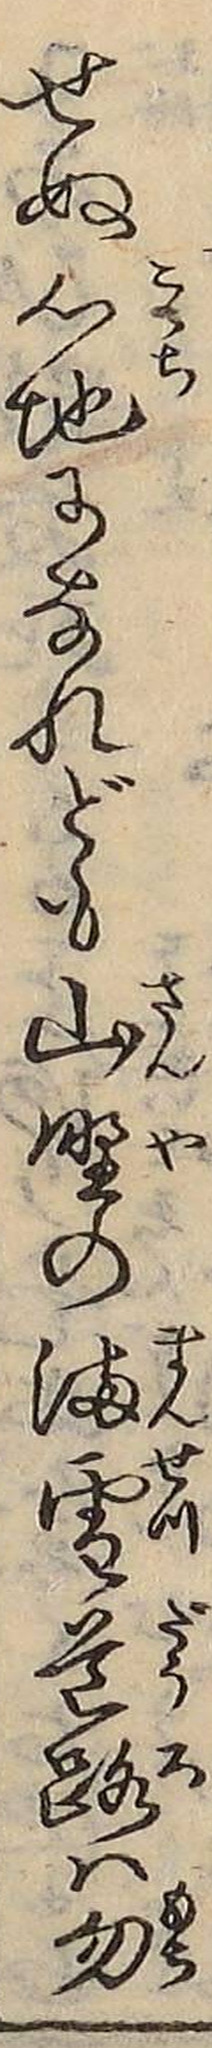せぬ心地になれども山野の満雪道路は勿
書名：旅行用心集
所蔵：神戸大学附属図書館 国文学研究資料館
